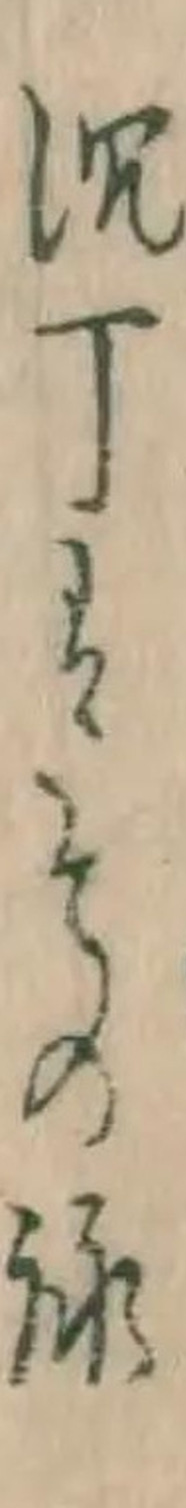沈丁はその様
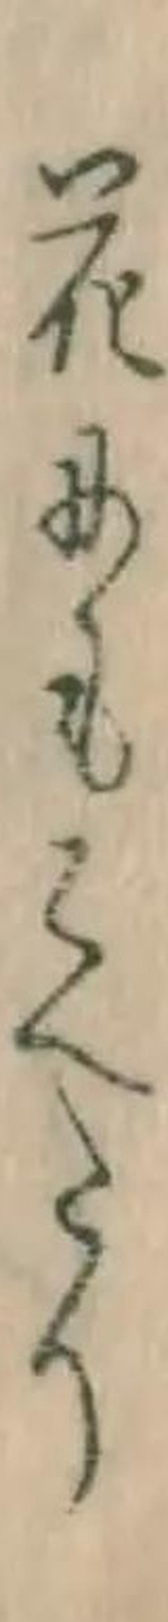花にもこへたり
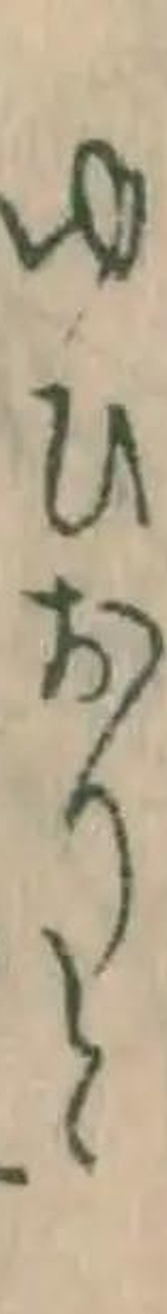ゆひおりと
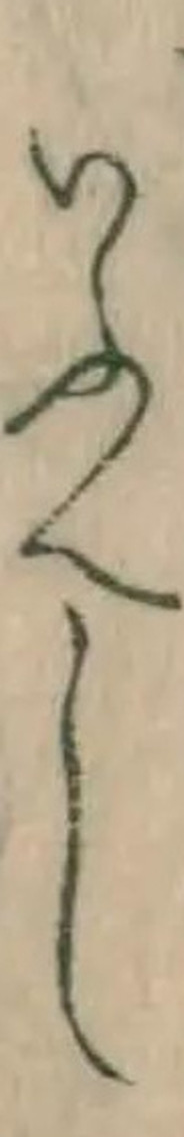いふへし
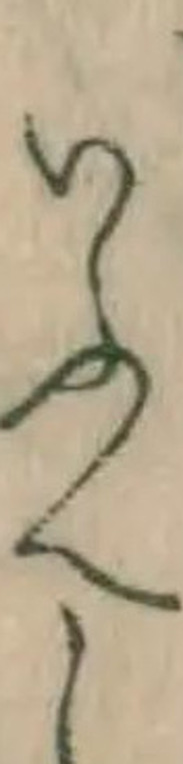いふへし
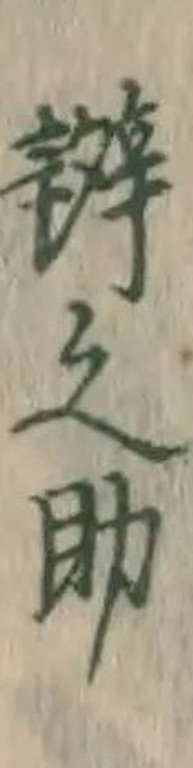辨之助

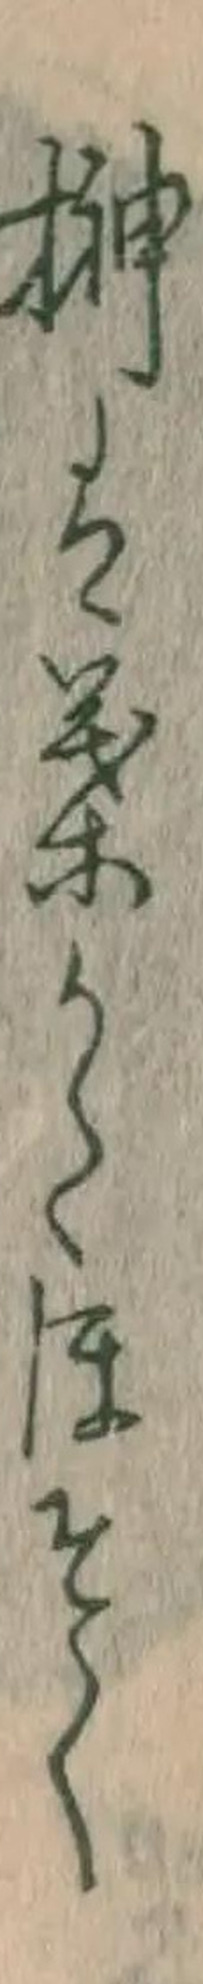榊は葉かたほそく
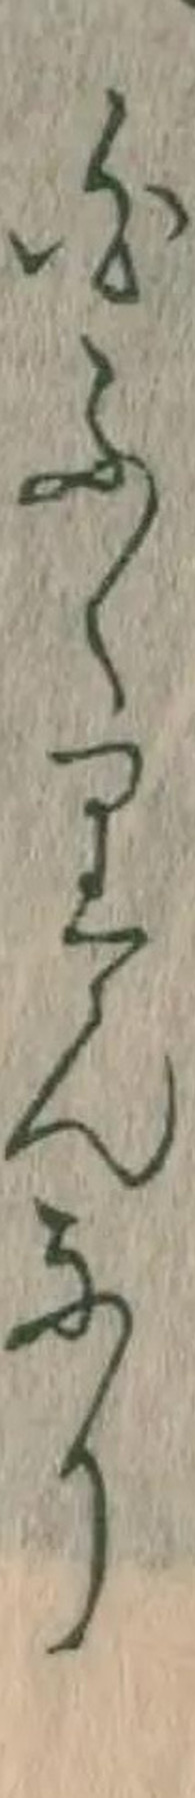白ふくりんなり
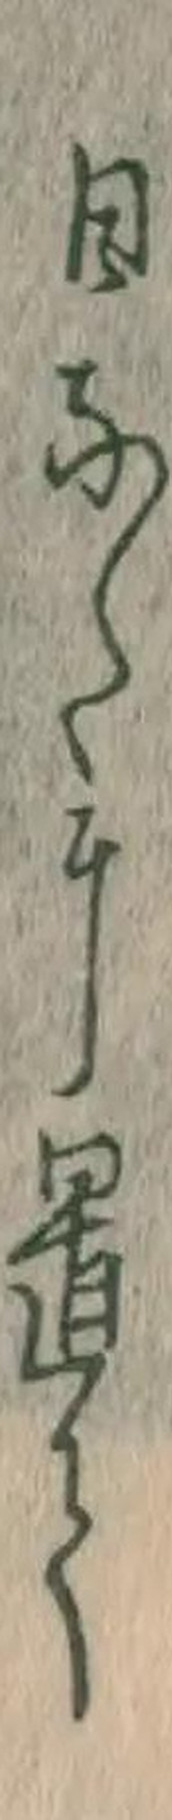日なたに置て
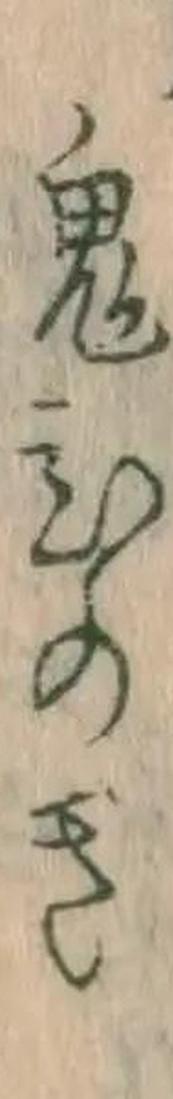鬼ひのき
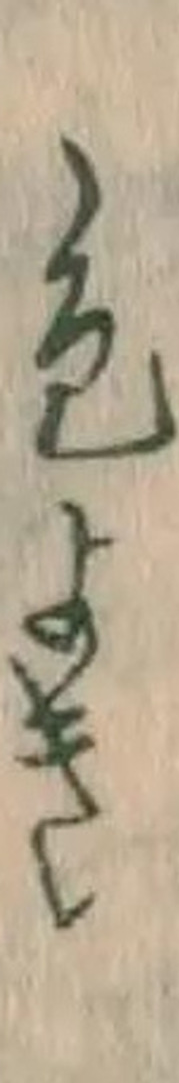色よき
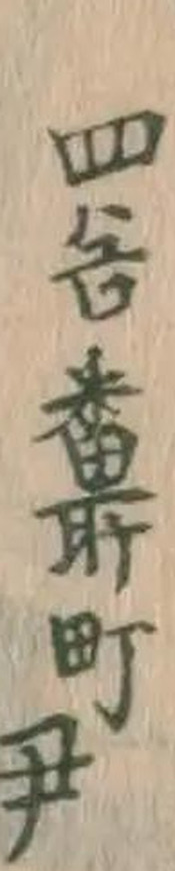四谷番所町
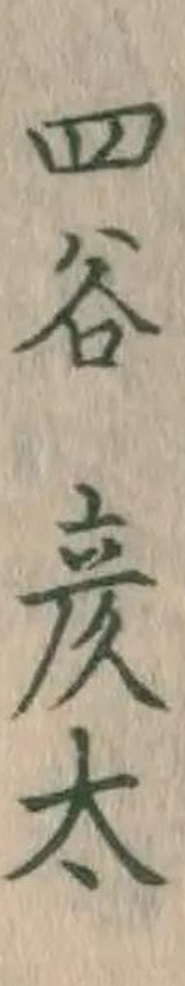四谷彦太
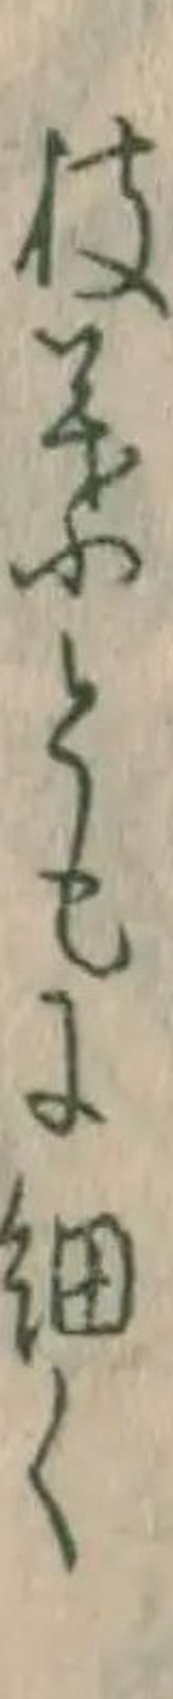枝葉ともに細く
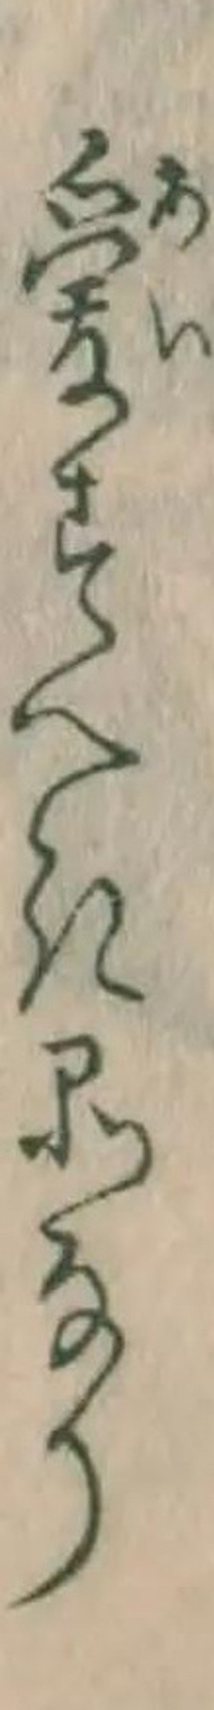愛すへき品なり

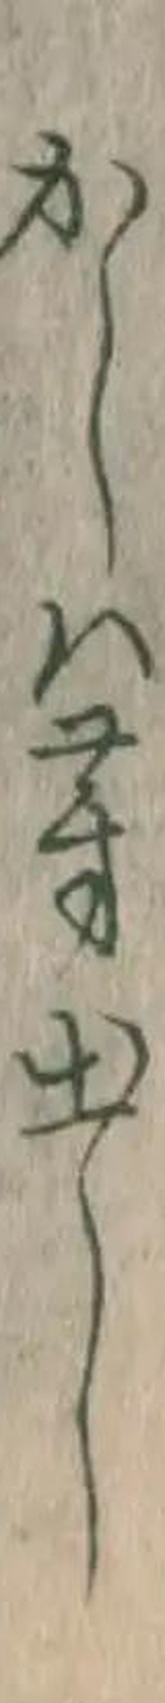かしは芽出し
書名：草木奇品家雅見 3巻. [3]
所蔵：国立国会図書館 National Diet Library, JAPAN
